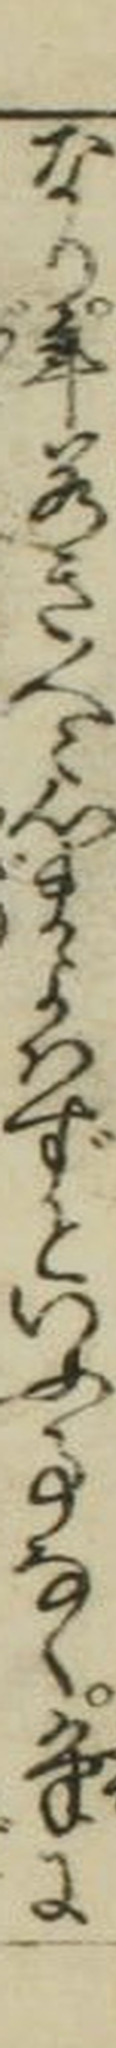なり。年若き人々心まよはずといふ事なく。筆に
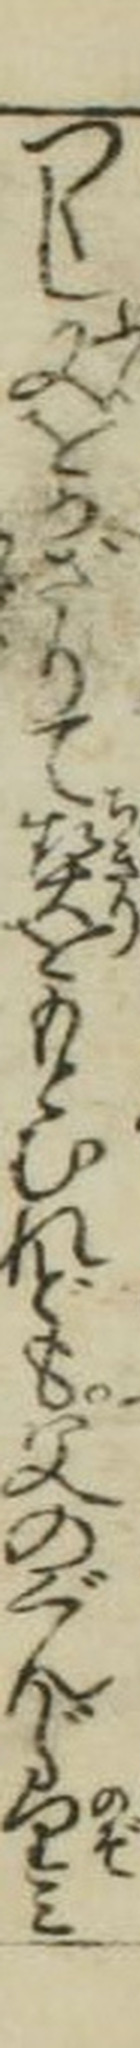つくし文をかざりて契をもとむれども。父のぐんじ望み
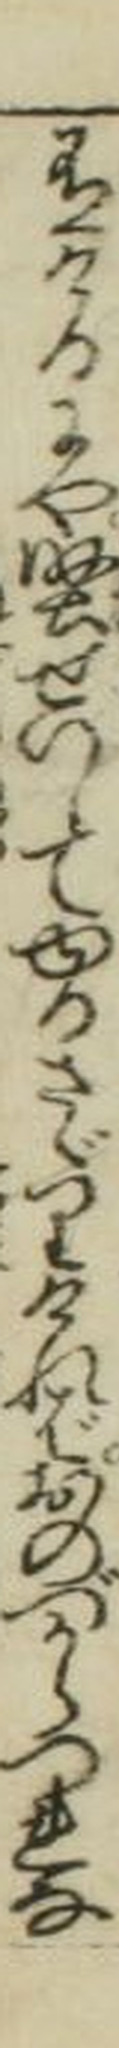有けるにや。堅せいしてゆるさゞりければ。おのづからつれな
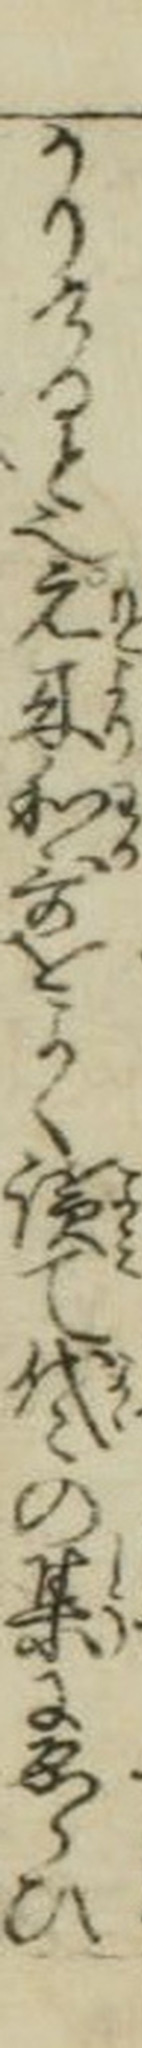かりけると也。元来和哥をよく読て代々の集にゑらひ
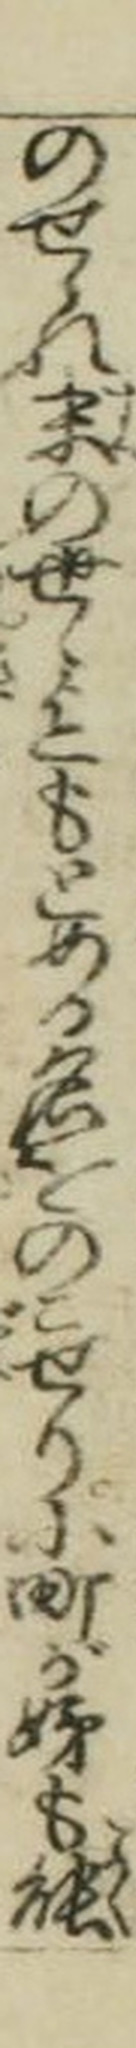のせられ末の世ゝ迄もとめる名をのこせり。小町が娣も能
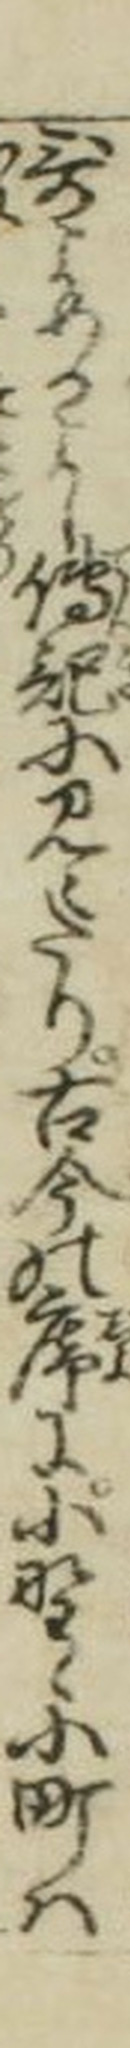哥よめるかし伝記に見えたり。古今の序に。小野々小町は
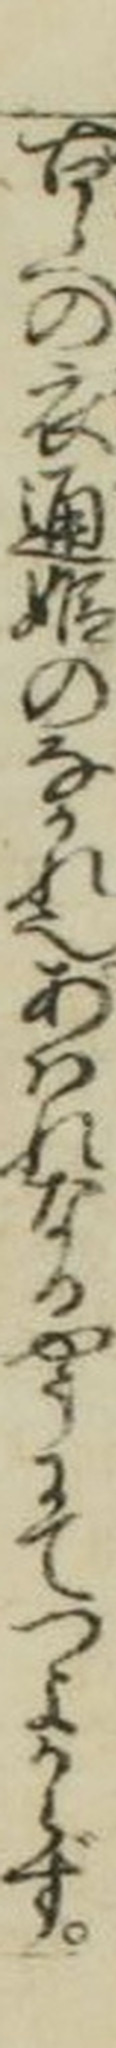古しへの衣通姫のなかれ也。あはれなるやうにてつよからず。
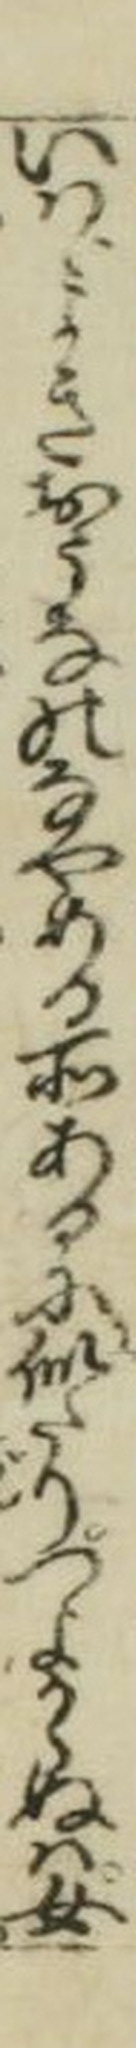いはゞよきおうなのなやめる所あるに似たり。つよからぬは。女
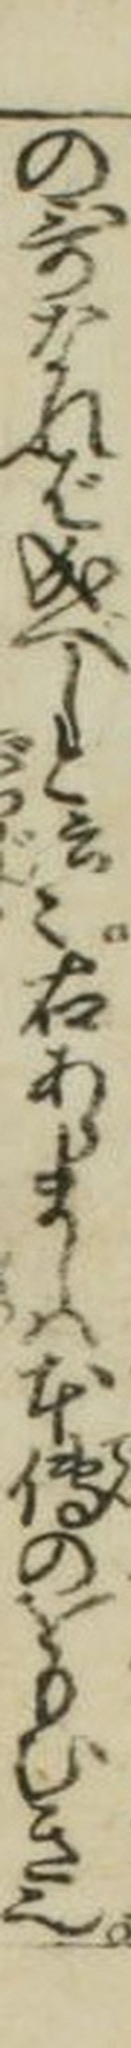の哥なれば成べしと云々。右あらましは本伝のをもむき也。
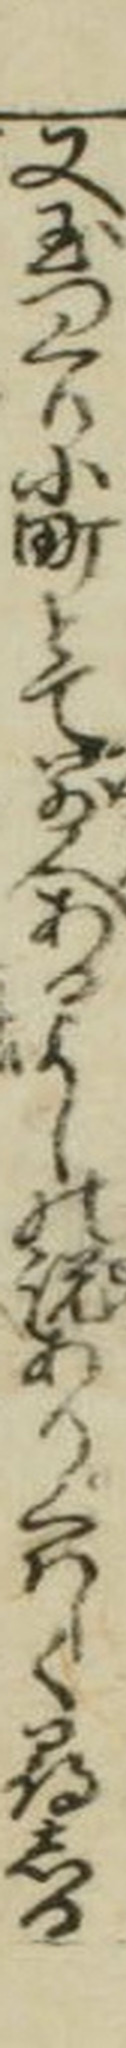又玉つくり小町とて別人あるよしの説あり。くわしく罷しる
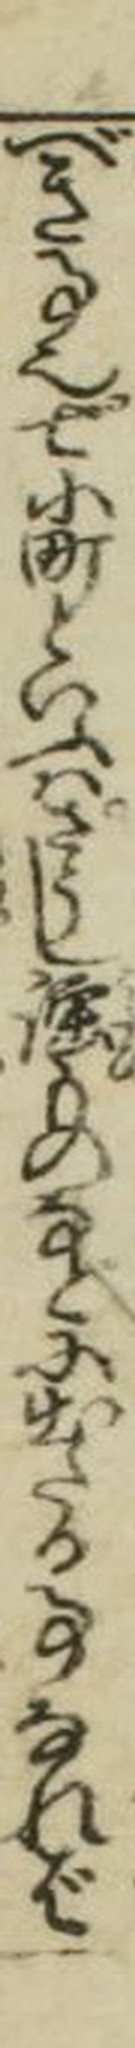べき事也。七小町といふは。さうし謡ものなどに出たる事なれば
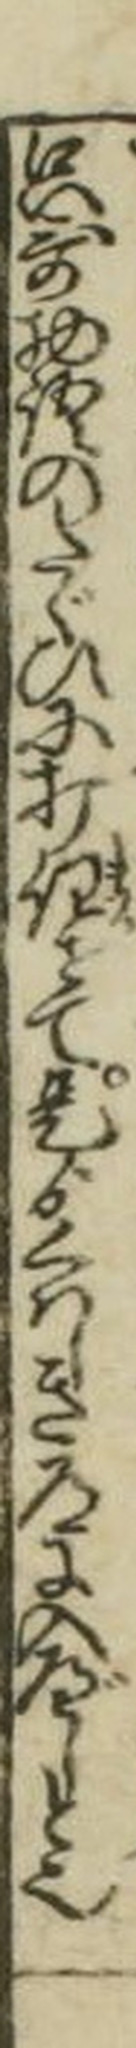只哥物語のたぐひに打任せて。是よりくはしき道に入べしと也
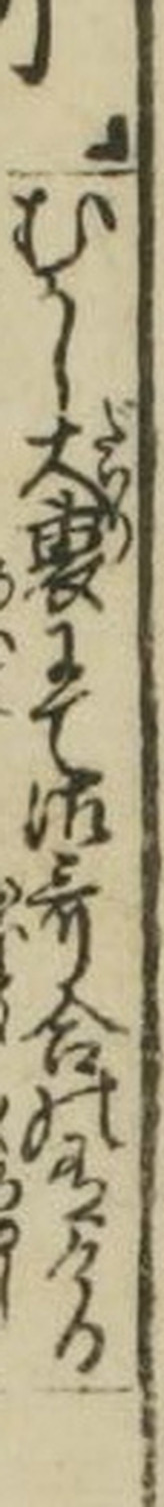むかし大裏にて御哥合の有ける
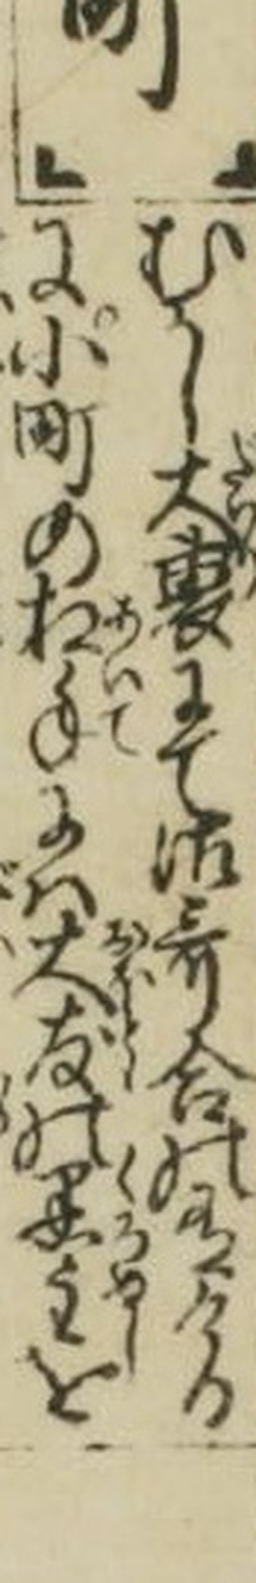に。小町の相手には大友の黒主を
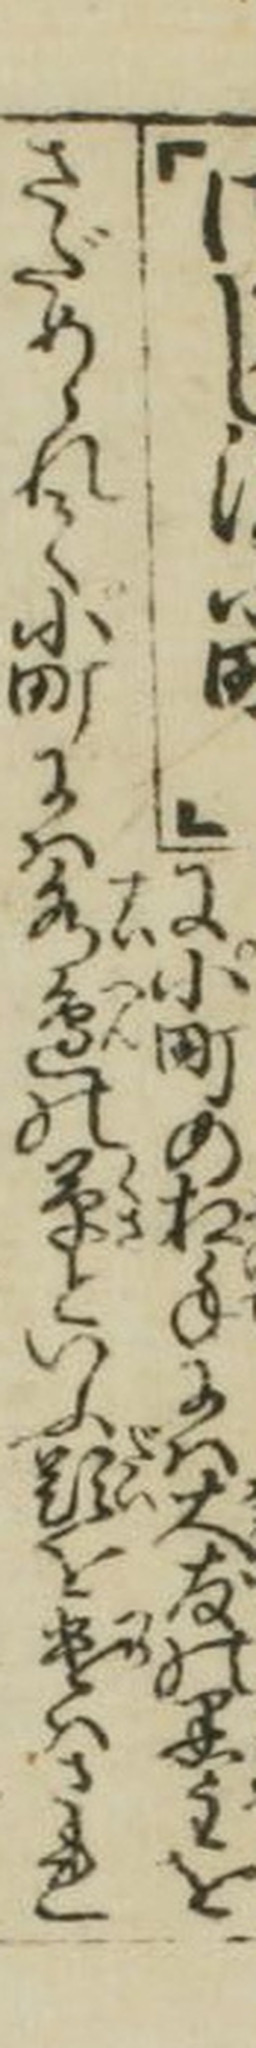さだめられて小町には水辺の草といふ題を遣はされ
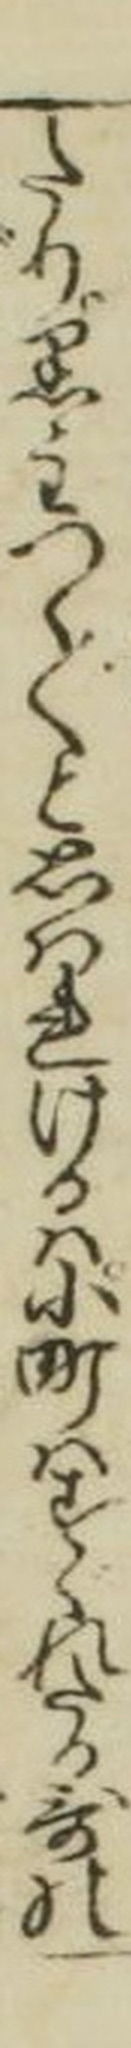たり。黒主つく〳〵と思はれけるは。小町はすぐれたる哥の
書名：女源氏教訓鑑
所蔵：東京学芸大学附属図書館
